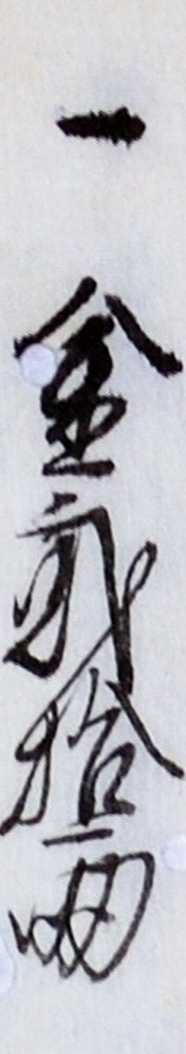一金弐拾両
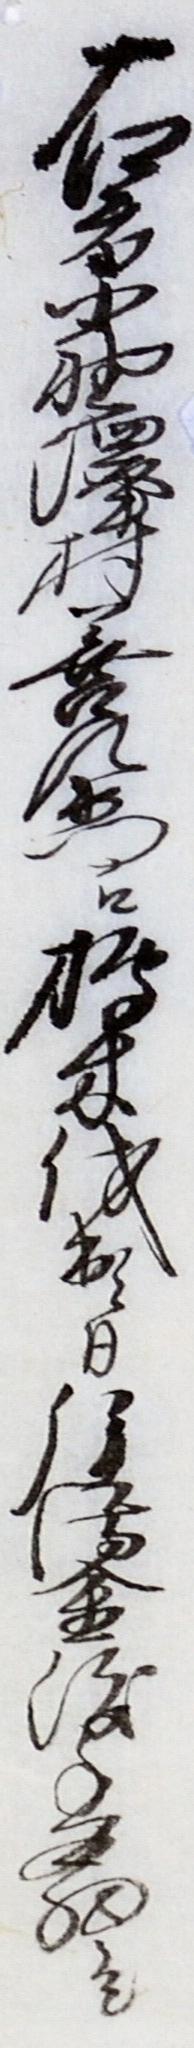右は小野澤村善左衛門江榑木伐出ニ付拝借金渡手委細は
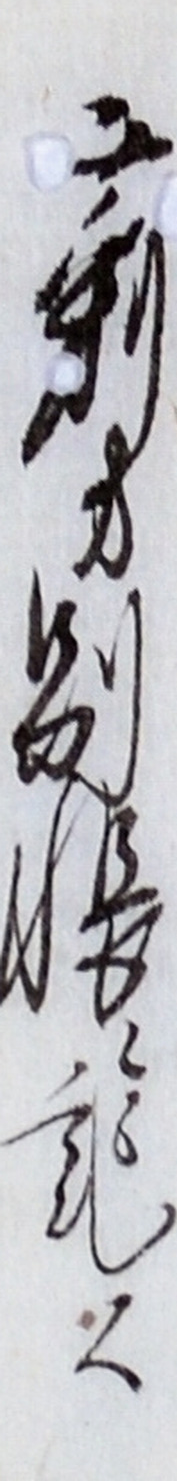薪方別帳ニ記ス
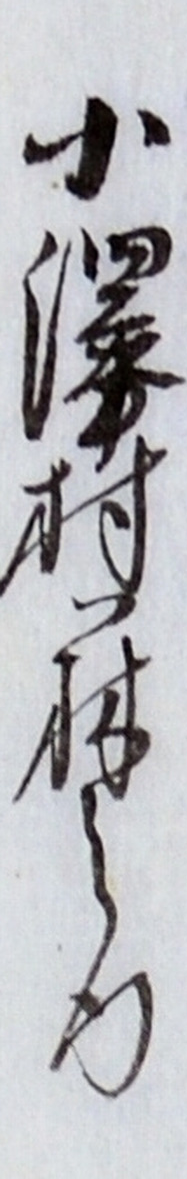小澤村御林之内
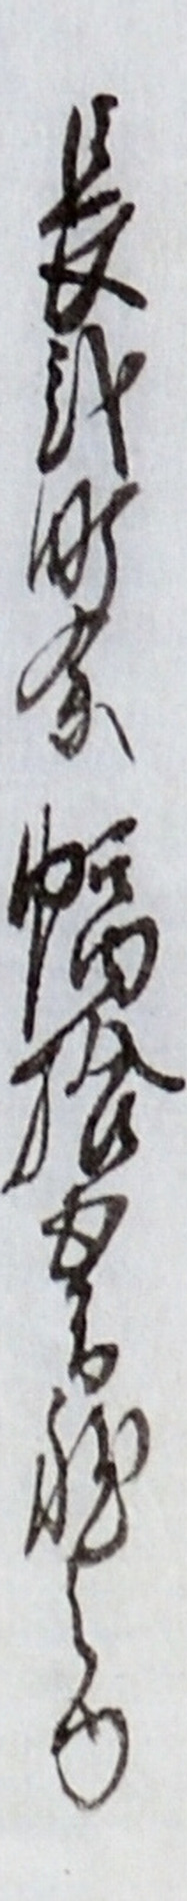長弐町余幅拾五間程之内
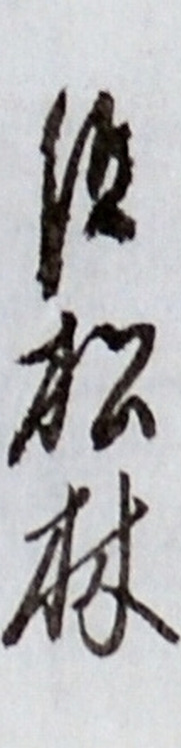但松林
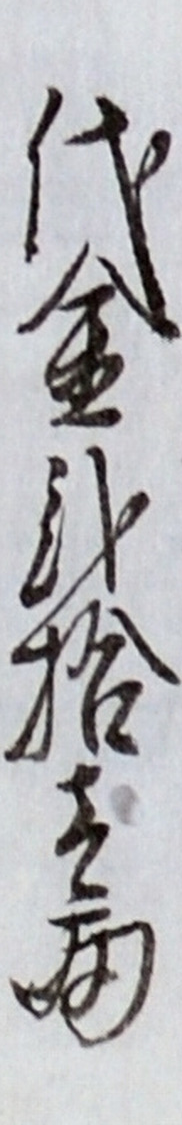代金弐拾壱両
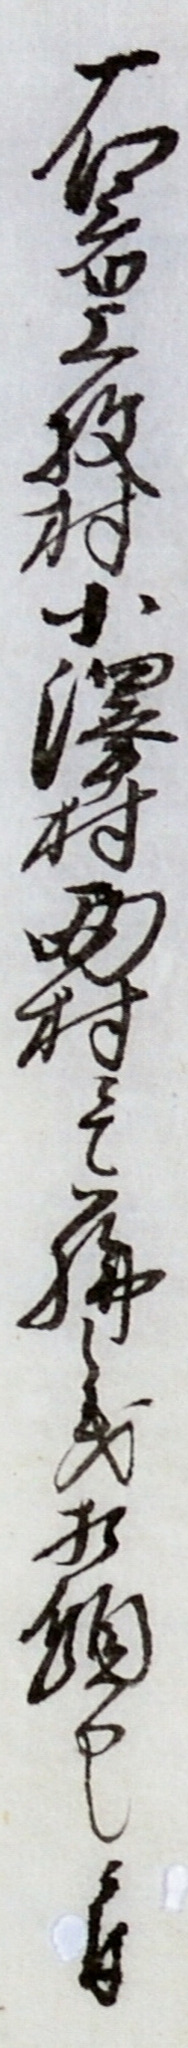右は上牧村小澤村両村ニて御払之義相願申候ニ付
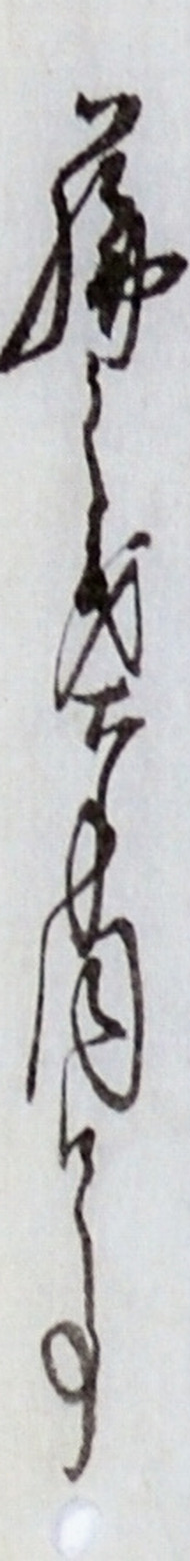御払之義奉伺候事

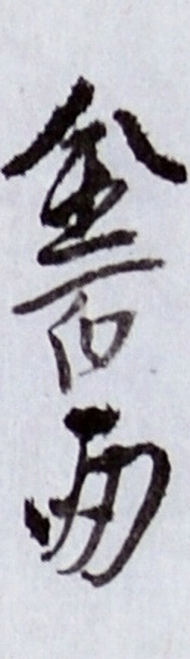金百両
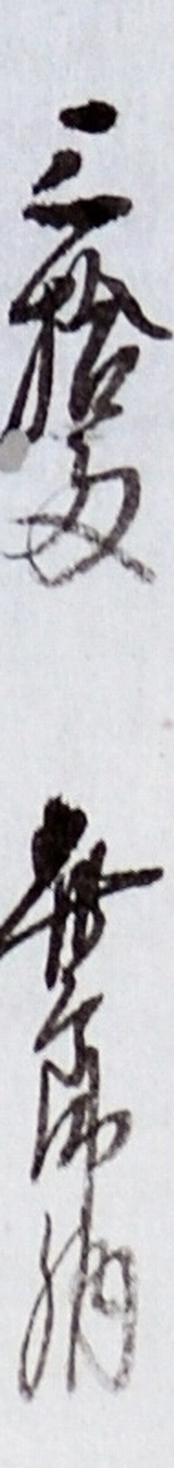内三拾両此節納
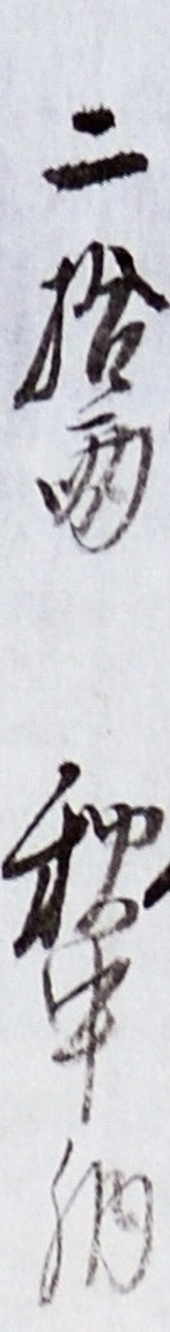二拾両秋中納
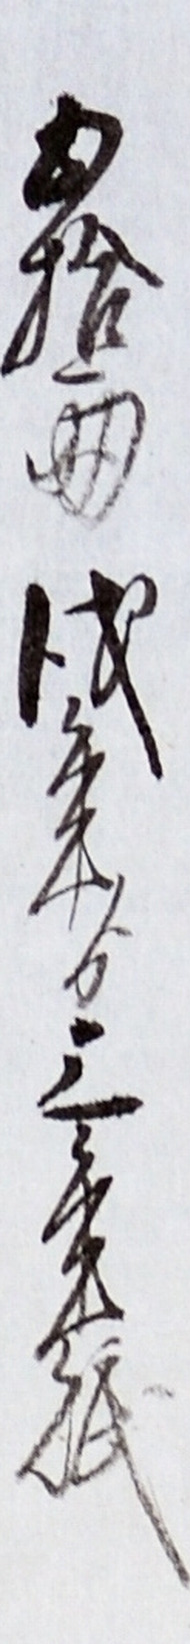五拾両戌年より三年賦
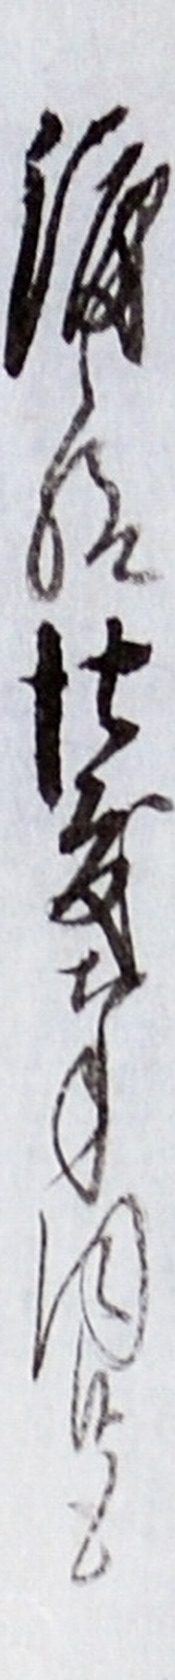渡候様仕度奉伺候以上
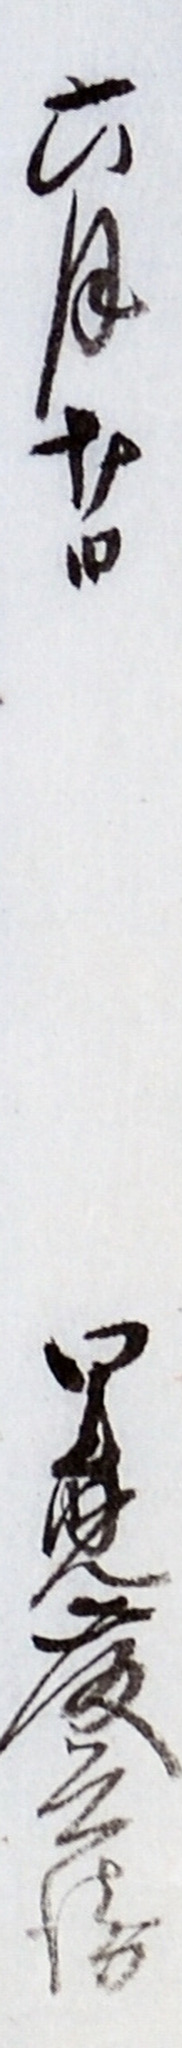六月廿日里見藤兵衛
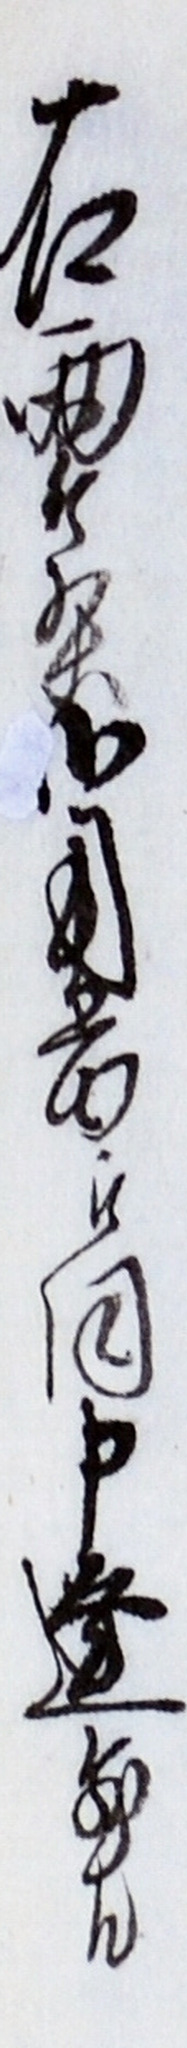右両ケ条御用番江伺申達置候
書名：御山奉行御用控
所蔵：伊那市立高遠町図書館・合同会社AMANE
